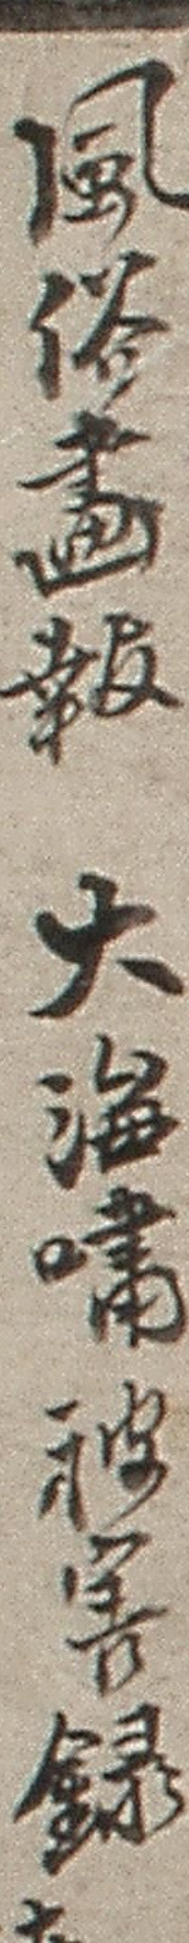風俗画報大海嘯被害録
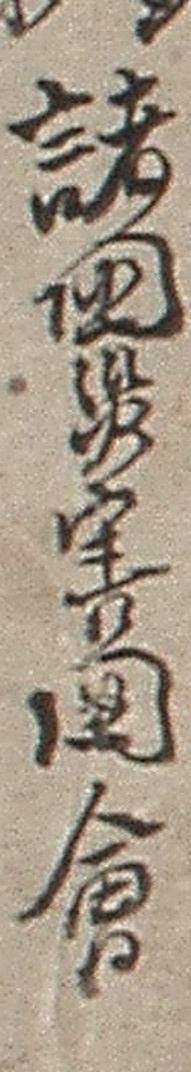諸国災害図会
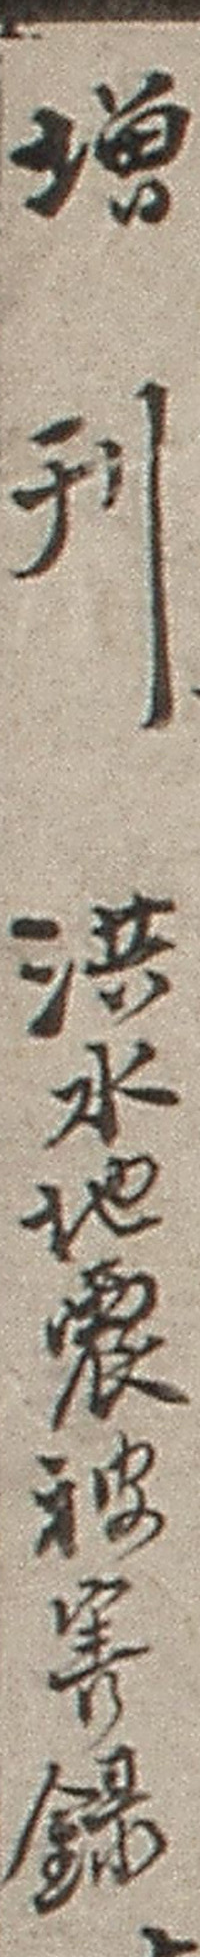増刊洪水地震被害録

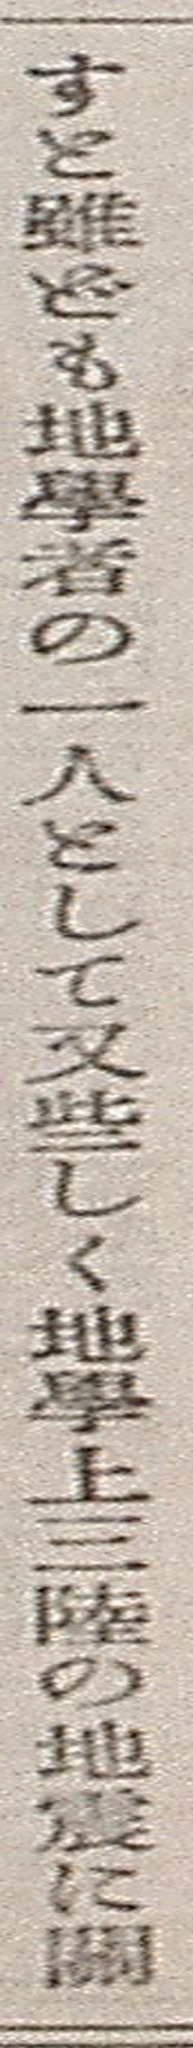すと雖ども地学者の一人として又些しく地学上三陸の地震に関
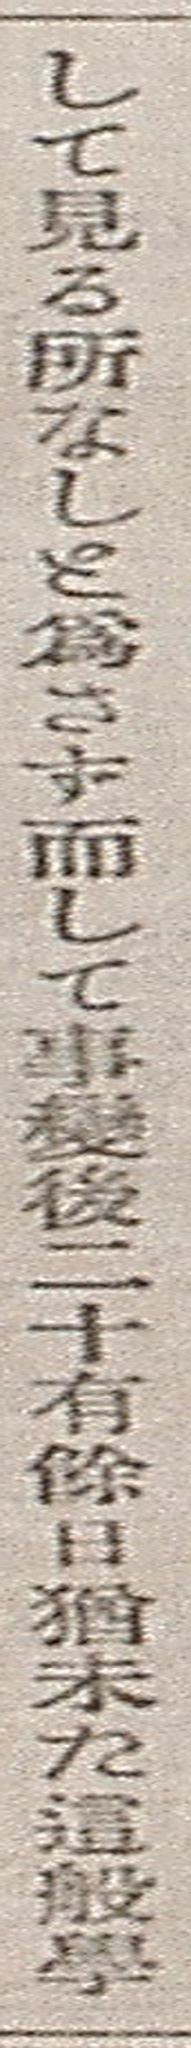して見る所なしと為さず而して事変後二十有余日尚未た這般学
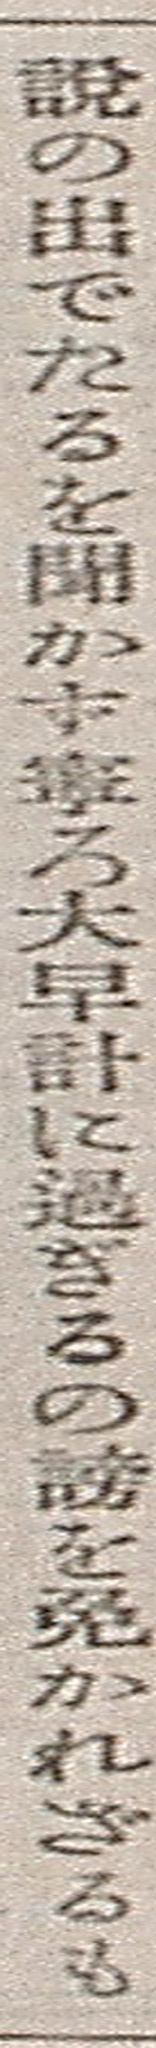説の出でたるを聞かず寧ろ大早計に過ぎるの謗を免かれざるも
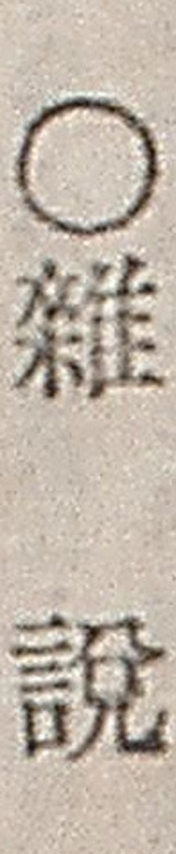○雑説
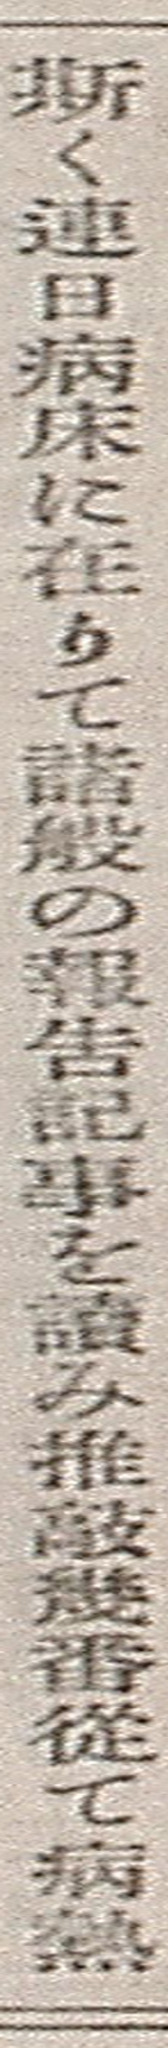斯く連日病床に在りて諸般の報告記事を読み推敲幾番従て病熱
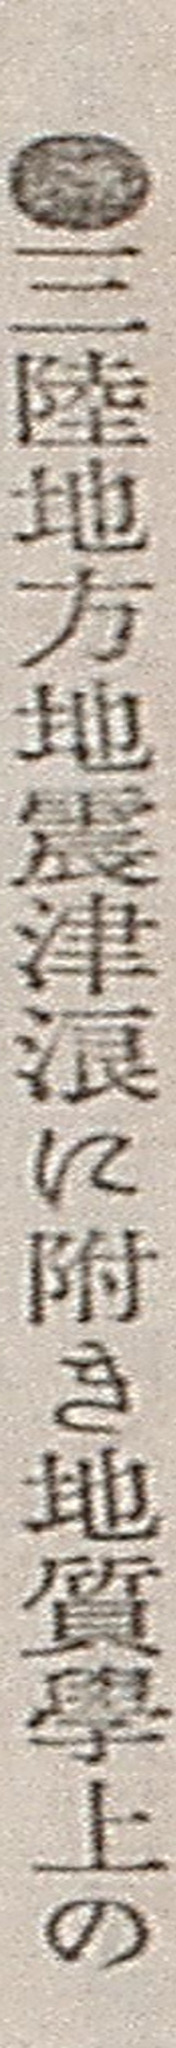●三陸地方地震津浪に付き地質学上の
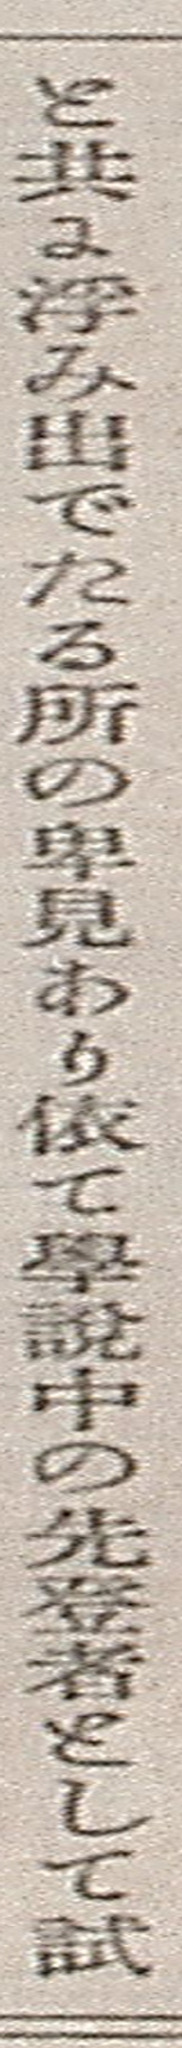と共に浮み出でたる所の卑見あり依て学説中の先登者として試
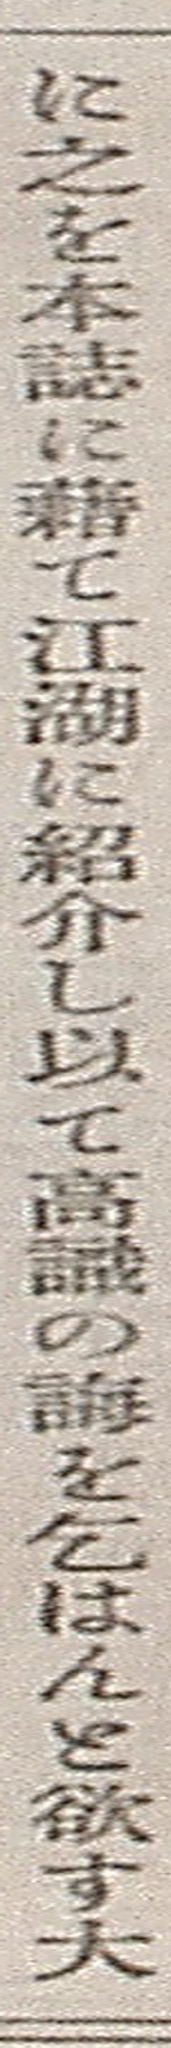に之を本誌に藉て江湖に紹介し以て高識の誨を乞はんと欲す大
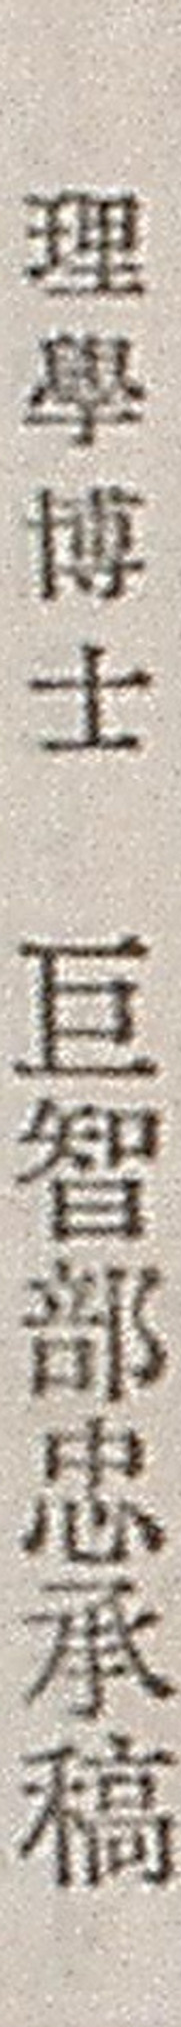理学博士巨智部忠承稿
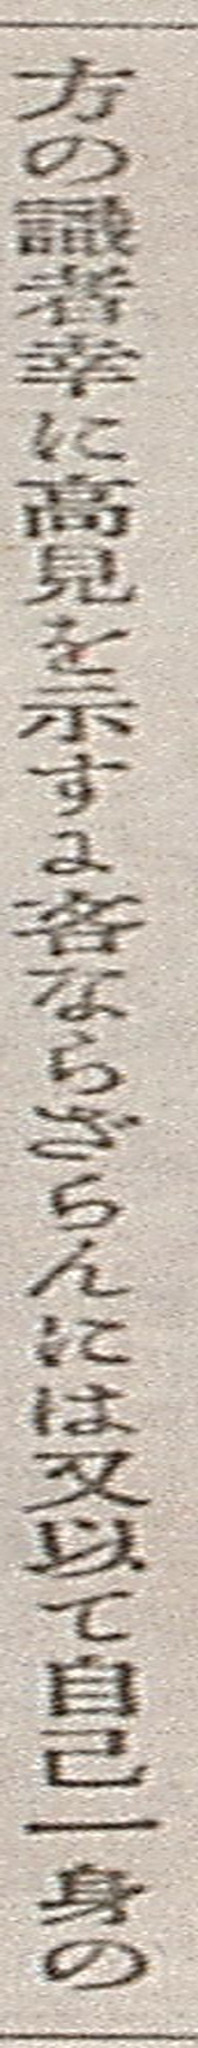方の識者幸に高見を示すに吝ならざらんには又以て自己一身の
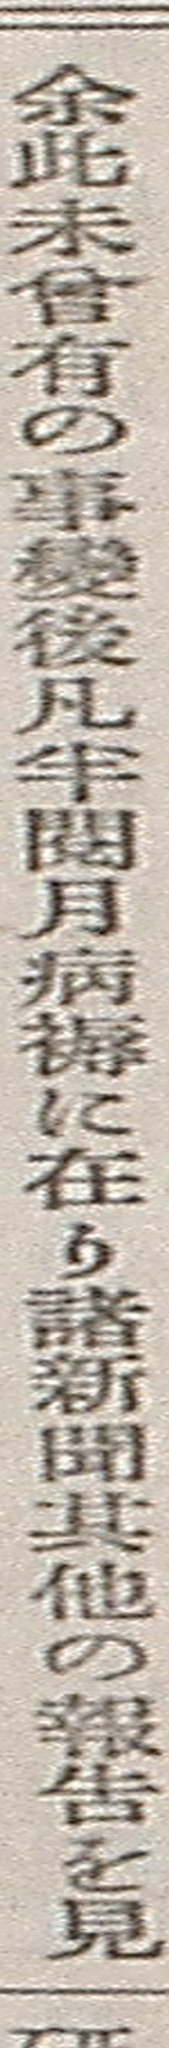余此未曽有の事変後凡半閲月病辱に在り諸新聞其他の報告を見
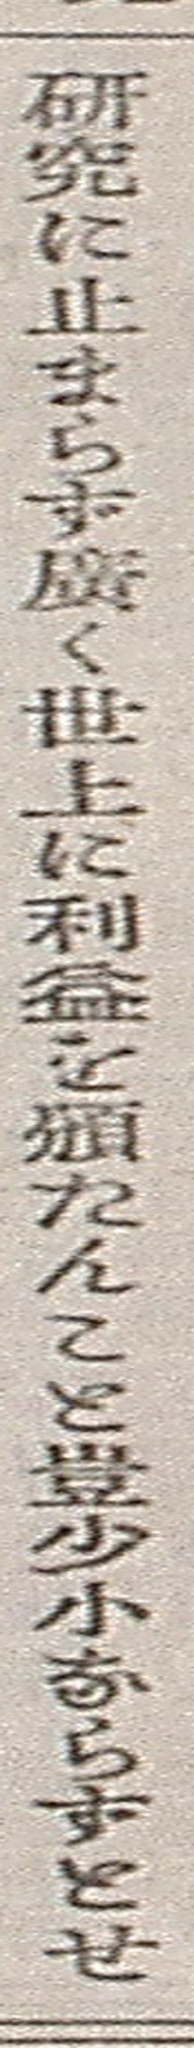研究に止まらず広く世上に利益を頒たんこと豈少小ならずとせ
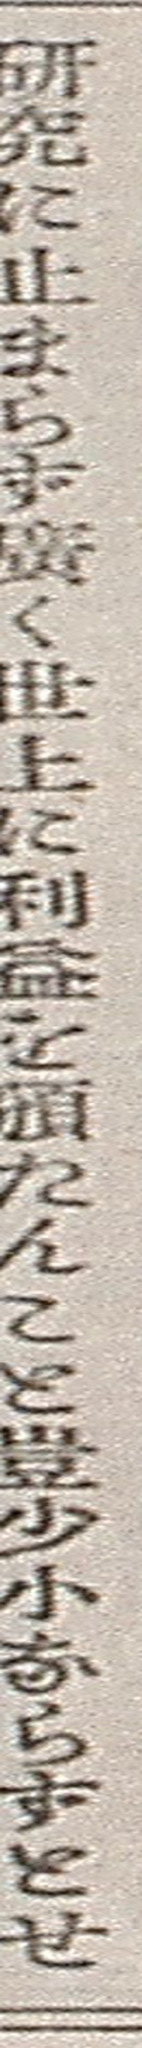研究に止まらず広く世上に利益を頒たんこと豈少小ならずとせ
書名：風俗畫報臨時増刊第百十九號　大海嘯被害録（中）
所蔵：東京大学地震研究所図書室 Earthquake Research Institute Library, The University of Tokyo, JAPAN
